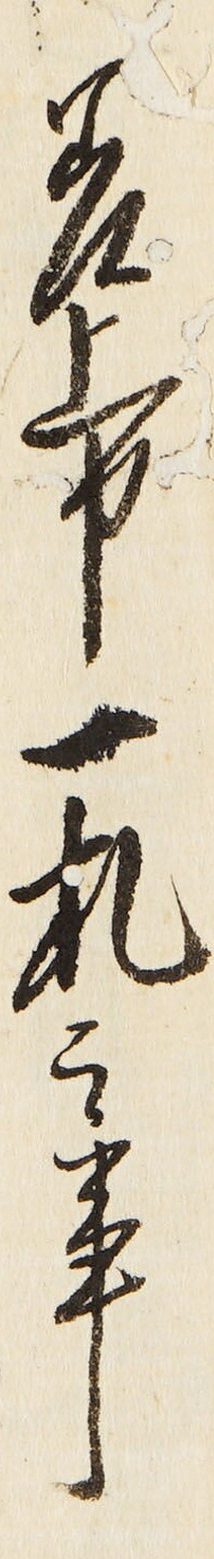差上申一札之事
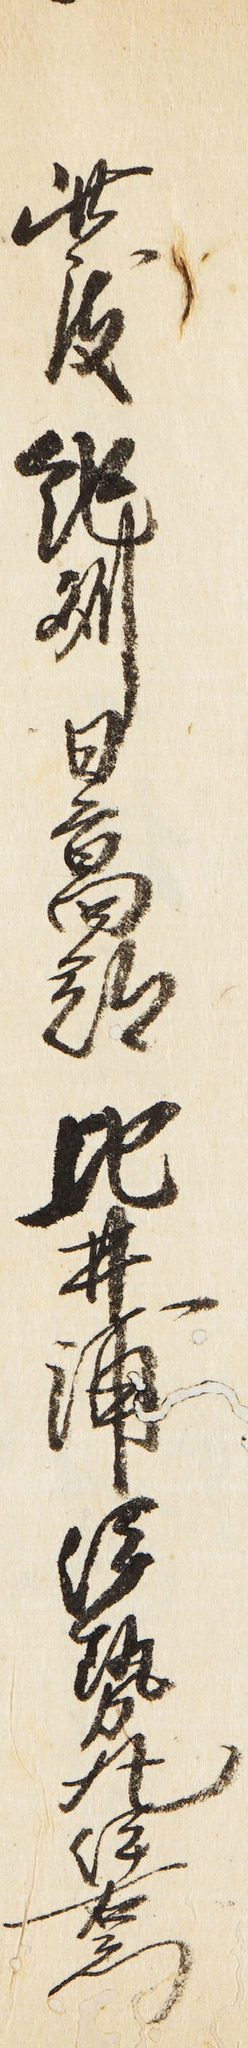一此度紀州日高郡比井浦伊勢丸伊右衛門
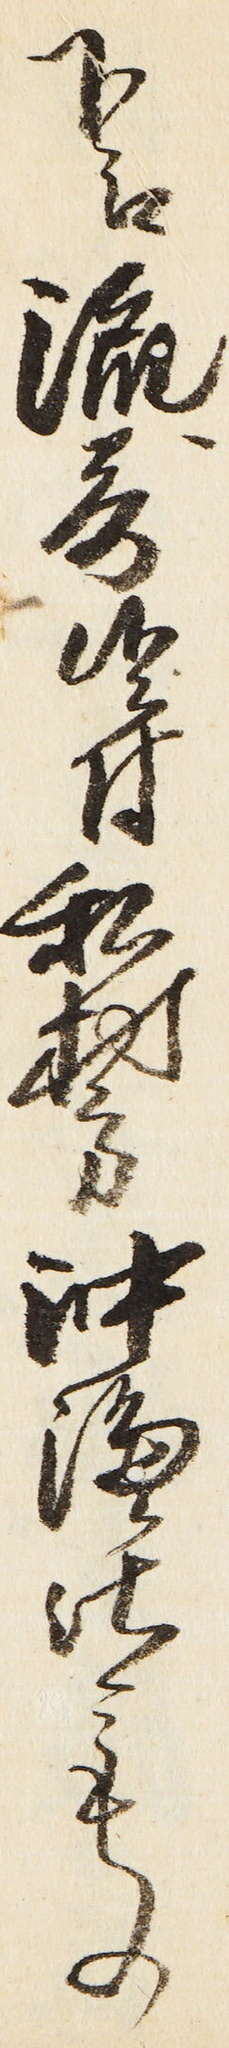下江流寄候ニ付私村方沖漁仕候もの
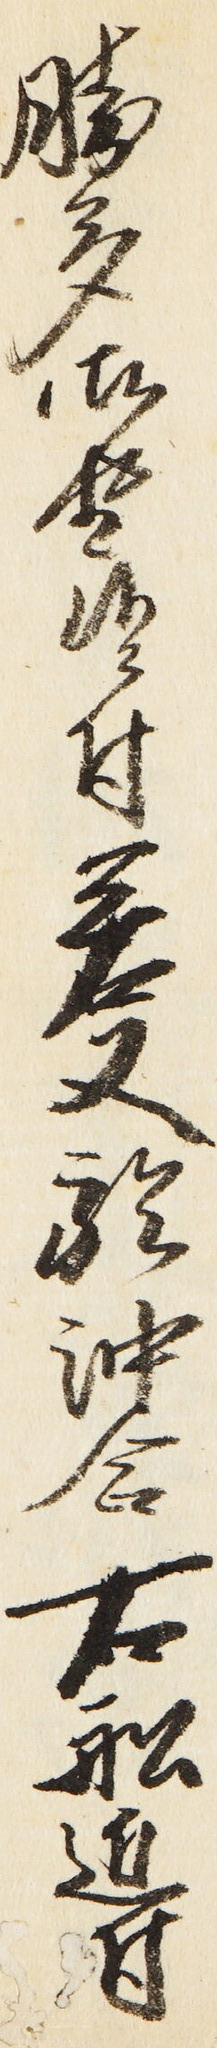勝多御座候ニ付若又於沖合右船近付
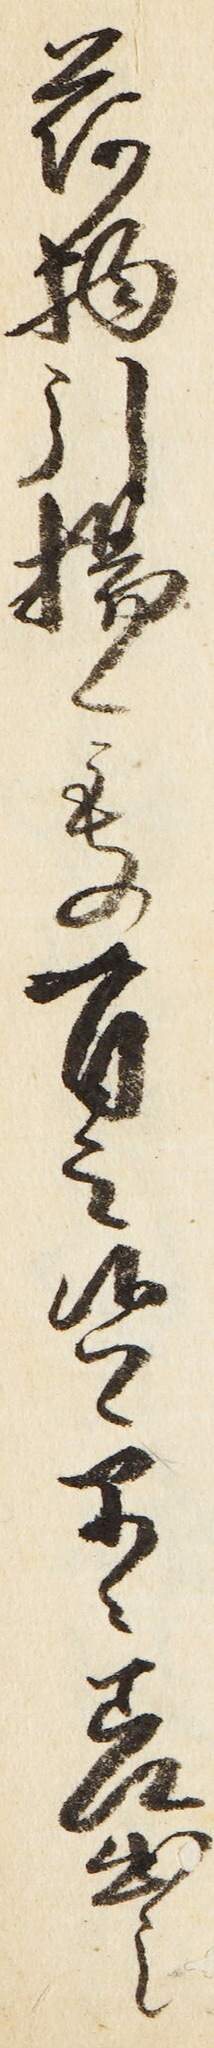荷物引揚候もの有之候ハヽ早々差出し

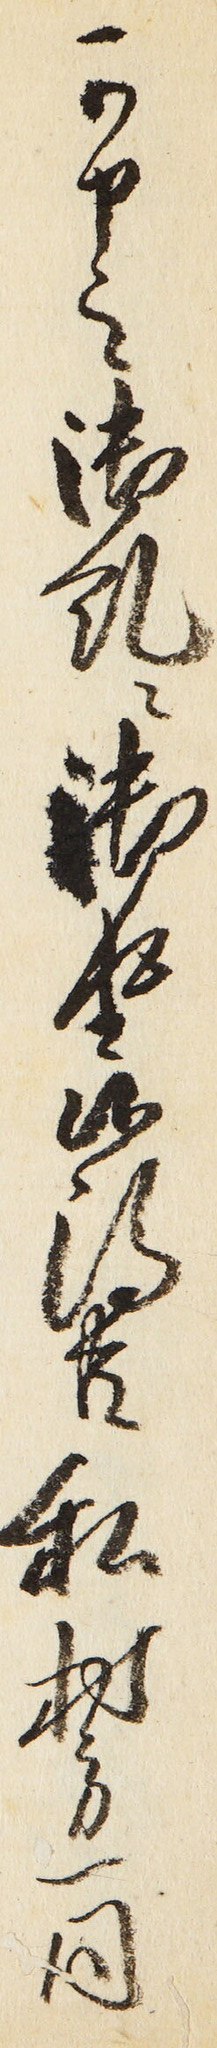可申之御糺ニ御座候得共私村方一同
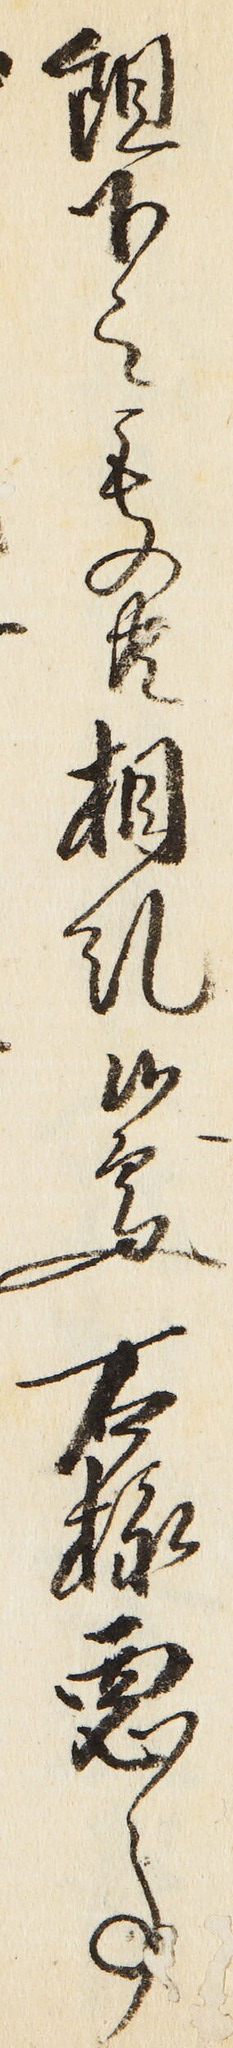組下之もの共相糺候処右様悪事
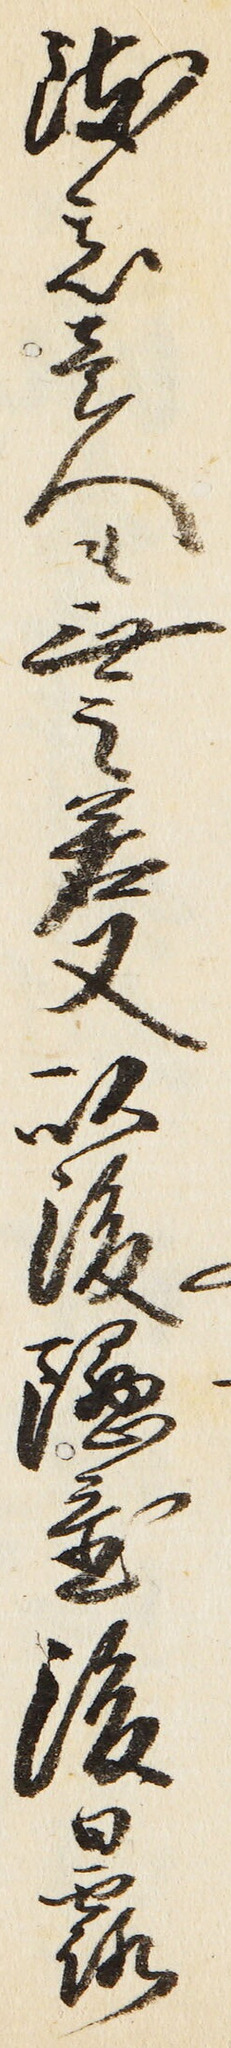致者壱人も無之若又以後隠置後日露
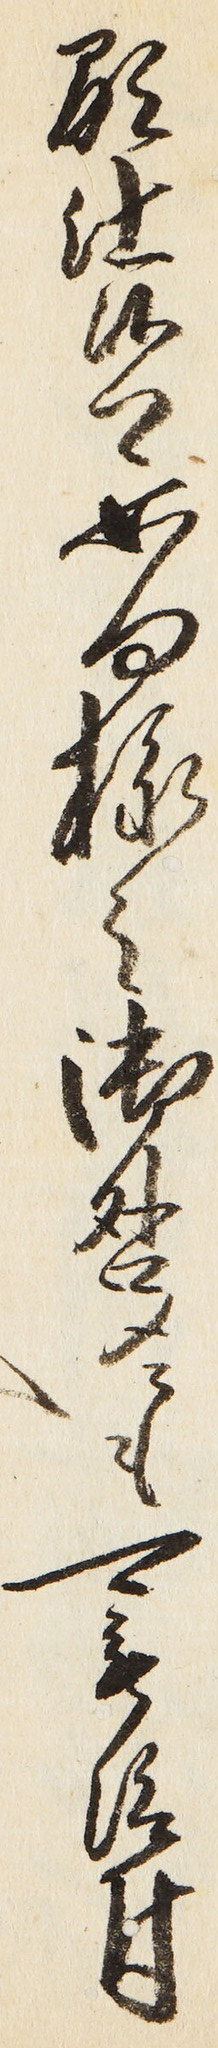顕仕候ハヽ如何様之御咎メニも可被仰付
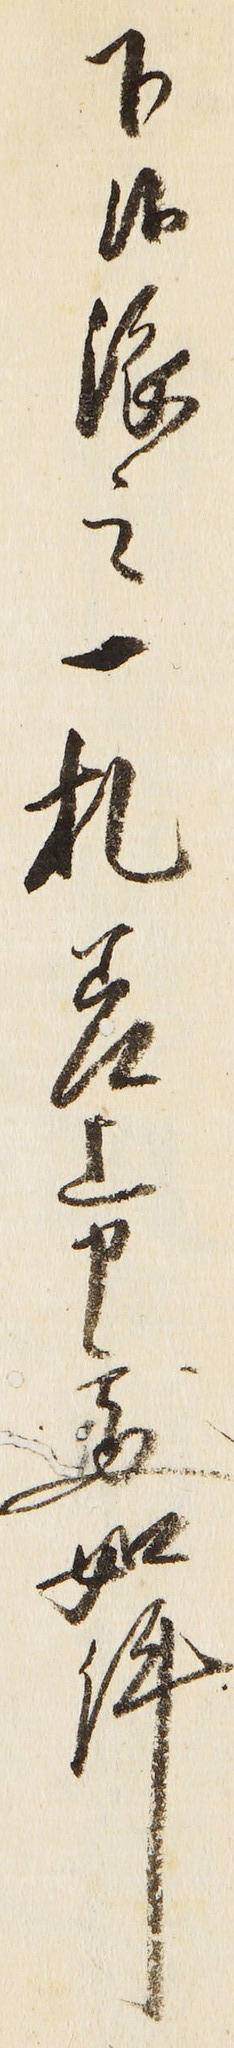下候依之一札差上申処如件
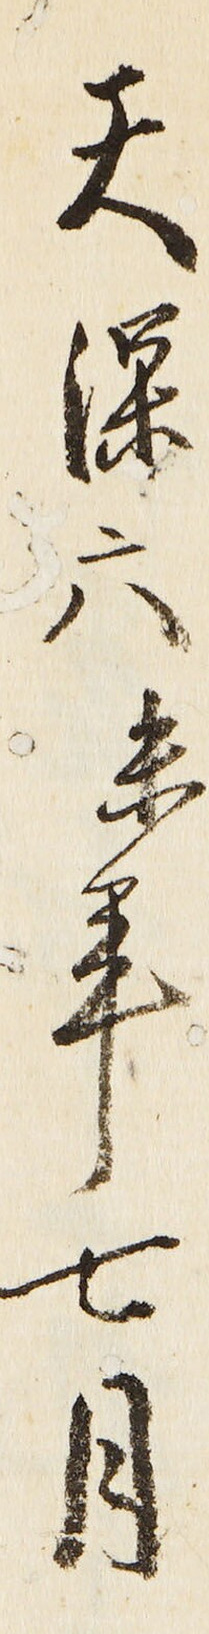天保六未年七月
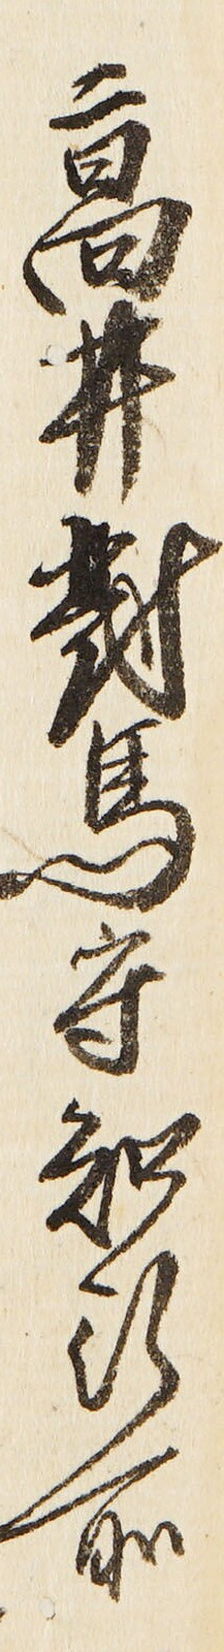高井対馬守知行所
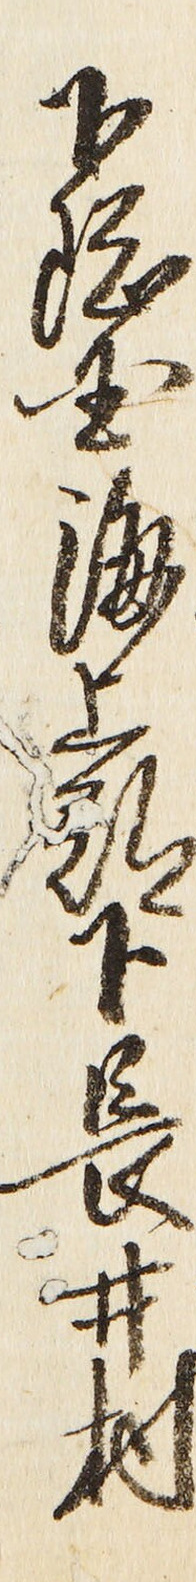下総国海上郡下長井村
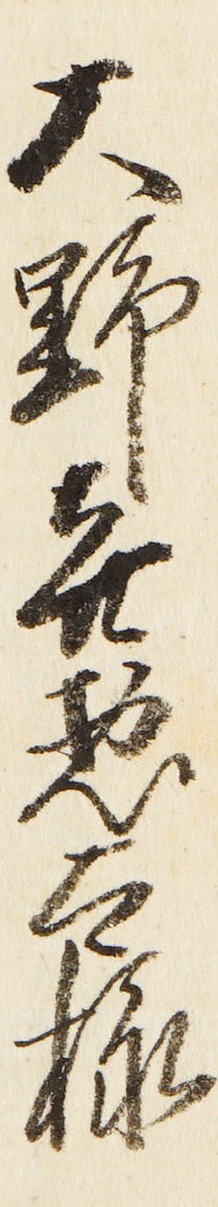大野喜惣太様

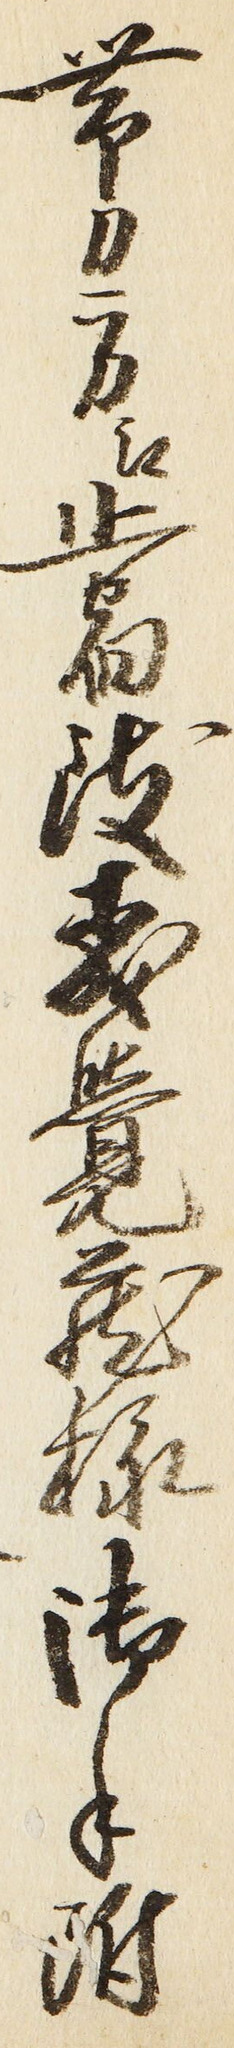帯刀方江止宿致森覚蔵様御手付
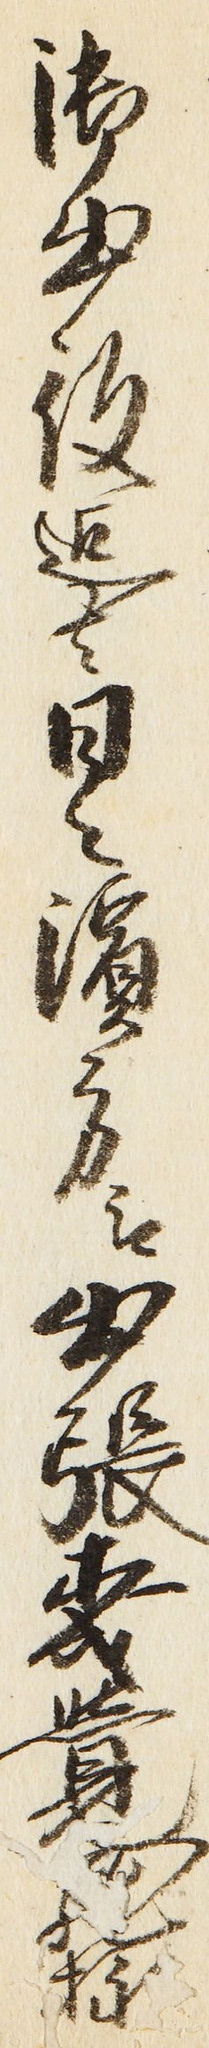御出役迄者日々浜方江出張森覚蔵様
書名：難船一件記録
